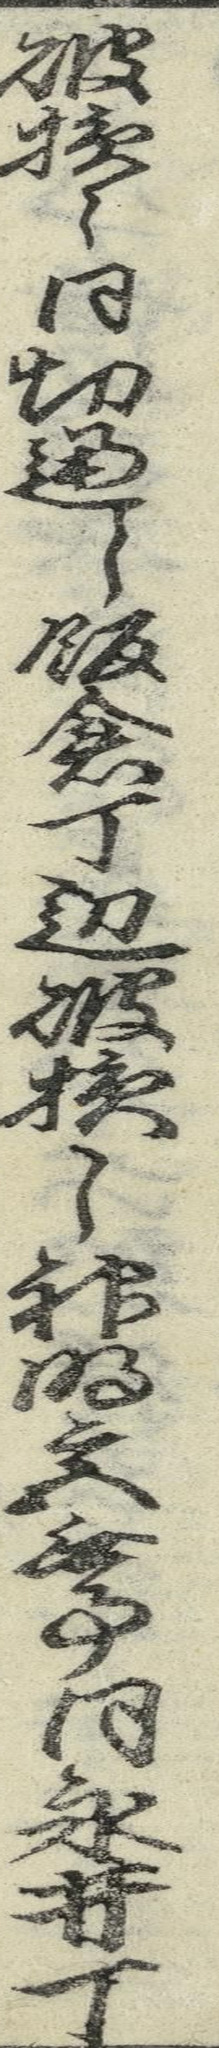破損し同切通し飯倉丁辺破損し神明宮無事同永井丁
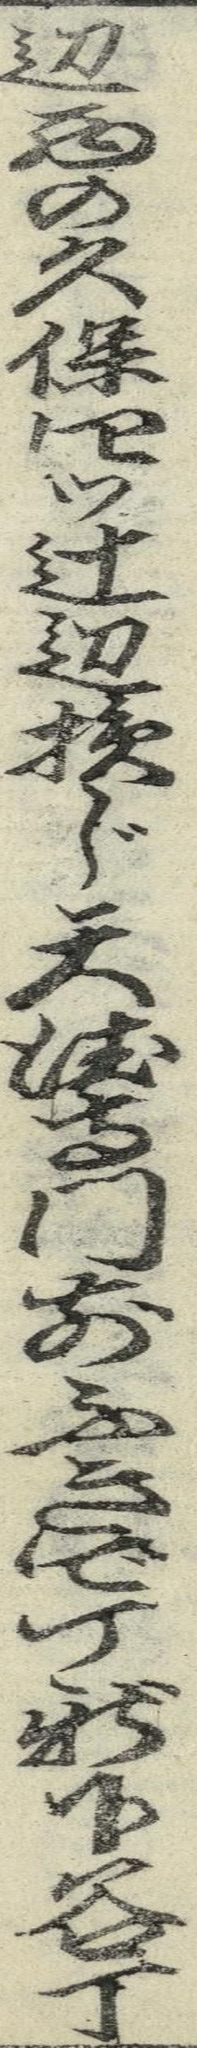辺西の久保四ツ辻辺損じ天徳寺門前ふきで丁新下谷丁
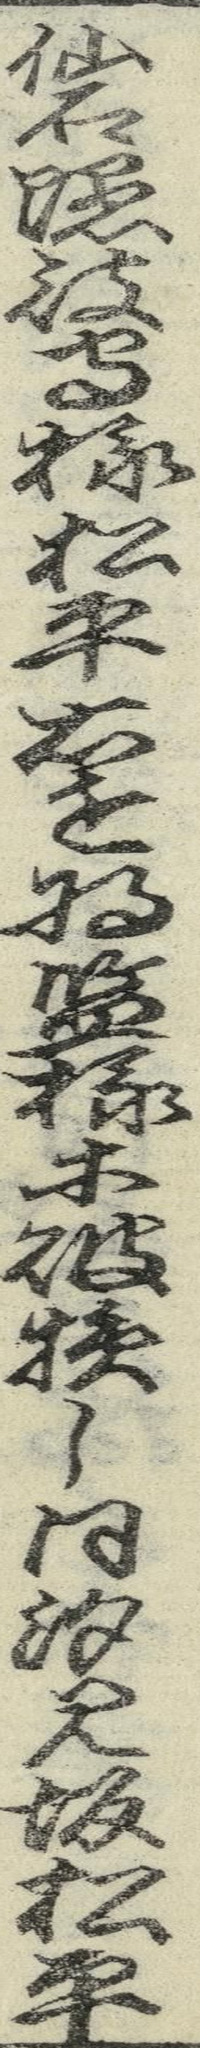仙石隠岐守様松平右近将監様等破損し同汐見坂松平
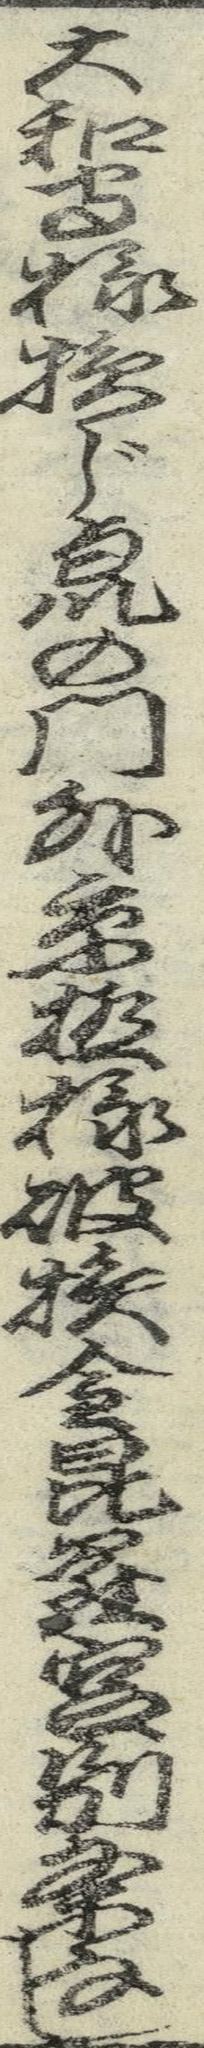大和守様損じ虎の門外京極様破損金昆羅宮別条なし
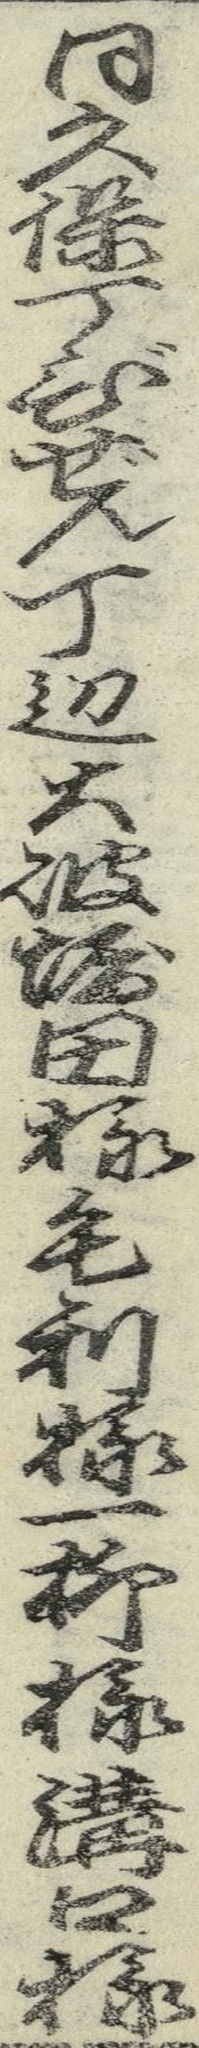同久保丁びぜん丁辺大破堀田様毛利様一柳様溝口様
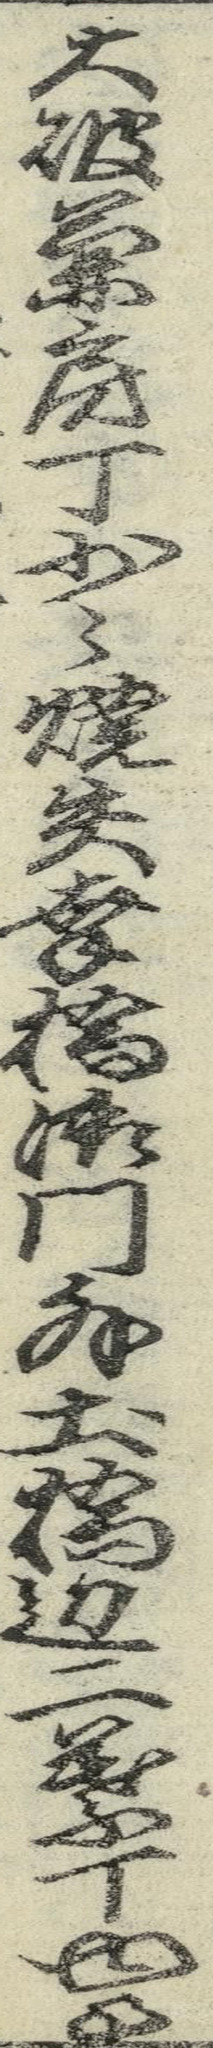大破兼房丁少々焼失幸橋御門外土橋辺二葉丁ゆる
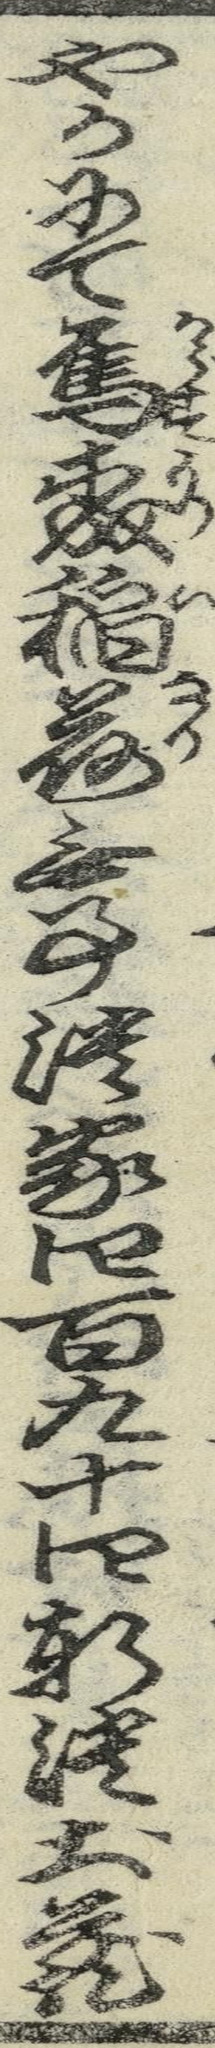やかにて烏森稲荷無事潰家四百九十四軒潰土蔵
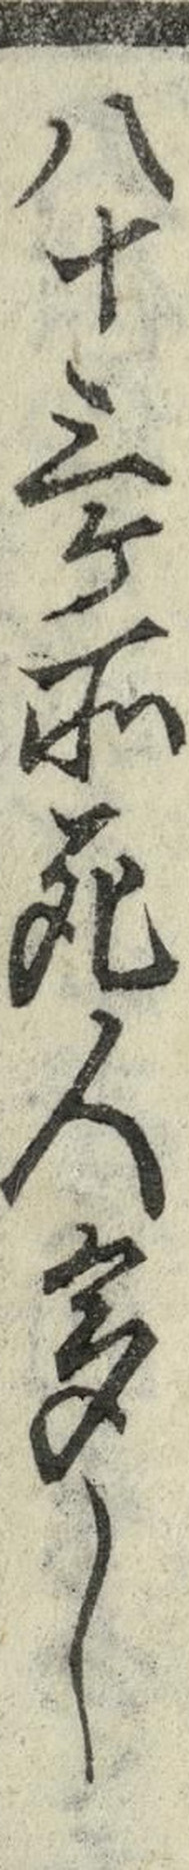八十三ヶ所死人多し
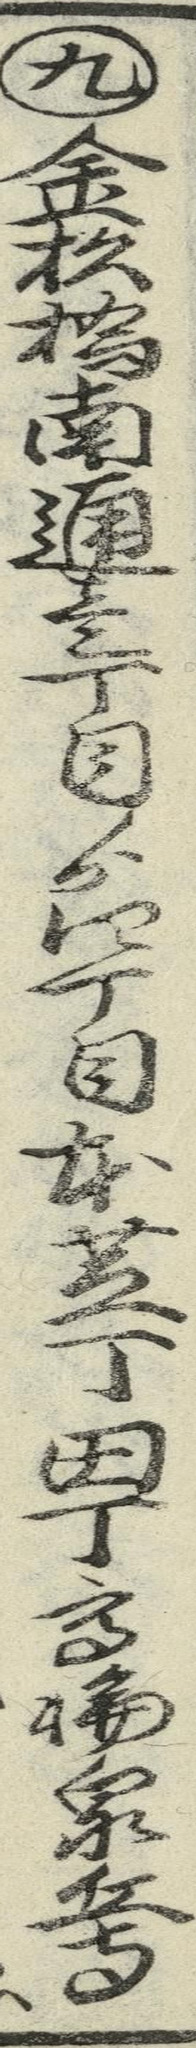㊈金杉橋南通壱丁目ゟ四丁目本芝丁田丁高輪泉丘寺
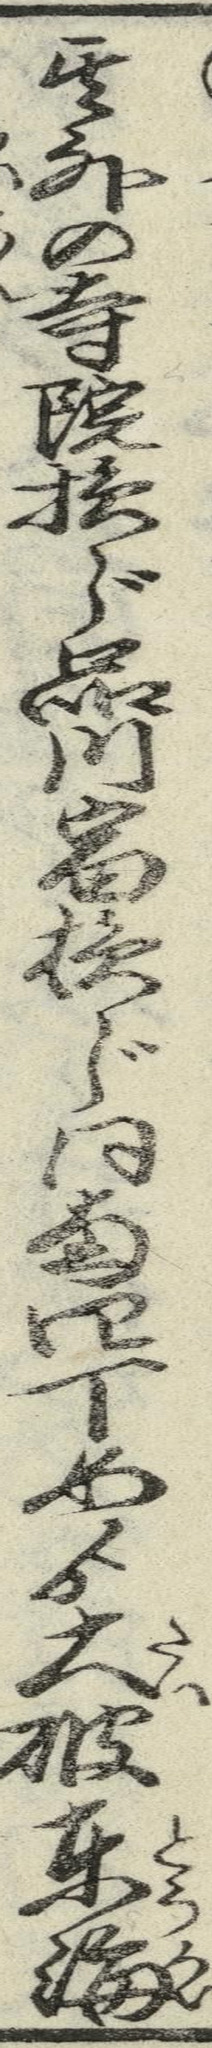其外の寺院損じ品川宿損じ同南四丁めゟ大破東海
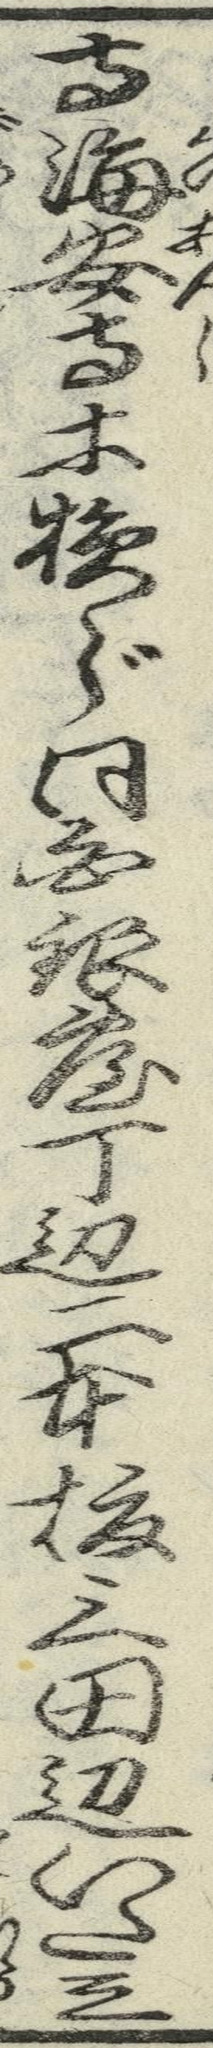寺海安寺等損じ同国銀屋丁辺二本榎三田辺いたみ
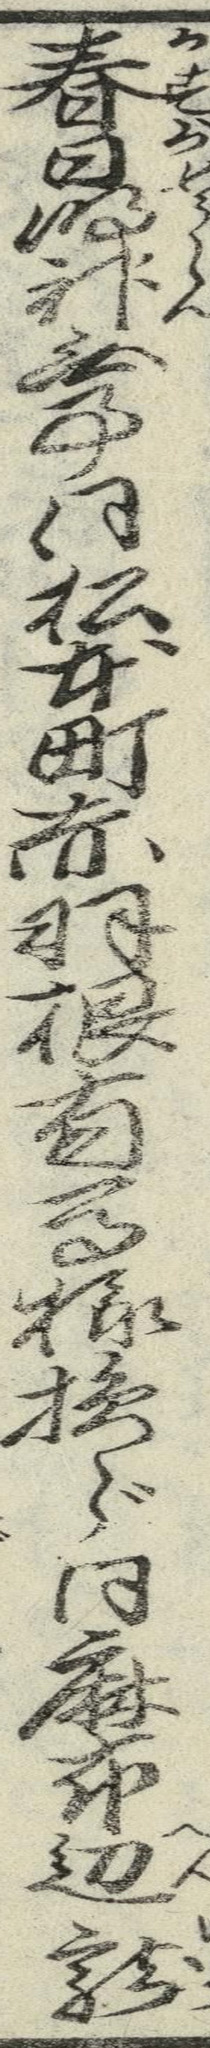春日明神無事同松本町赤羽根有馬様損じ同麻布辺龍
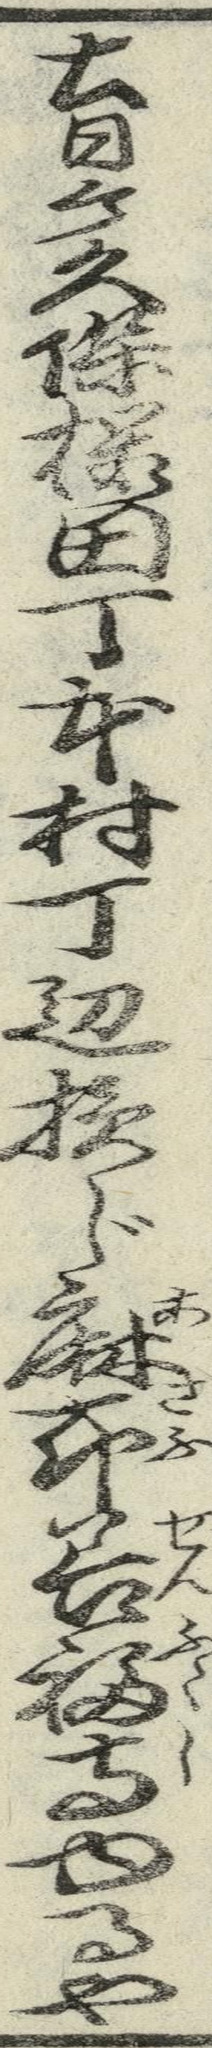土日ケ久保様田丁本村丁辺損じ麻布善福寺ゆるや
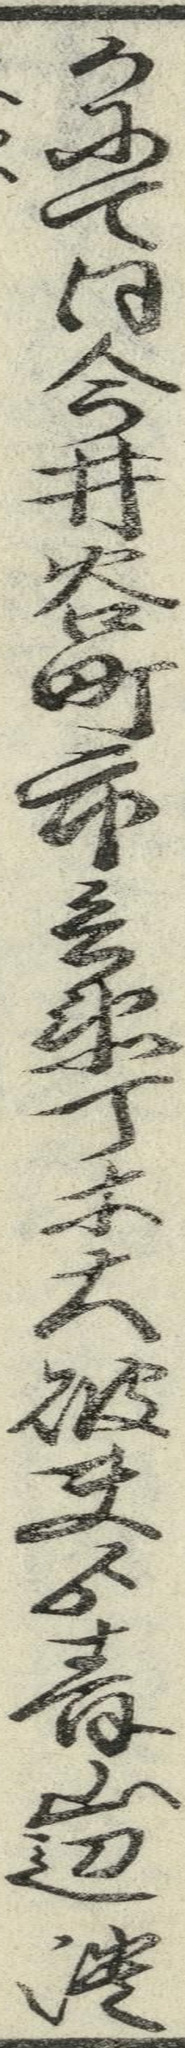かにて同今井谷町市兵衛丁等大破夫ゟ青山辺潰
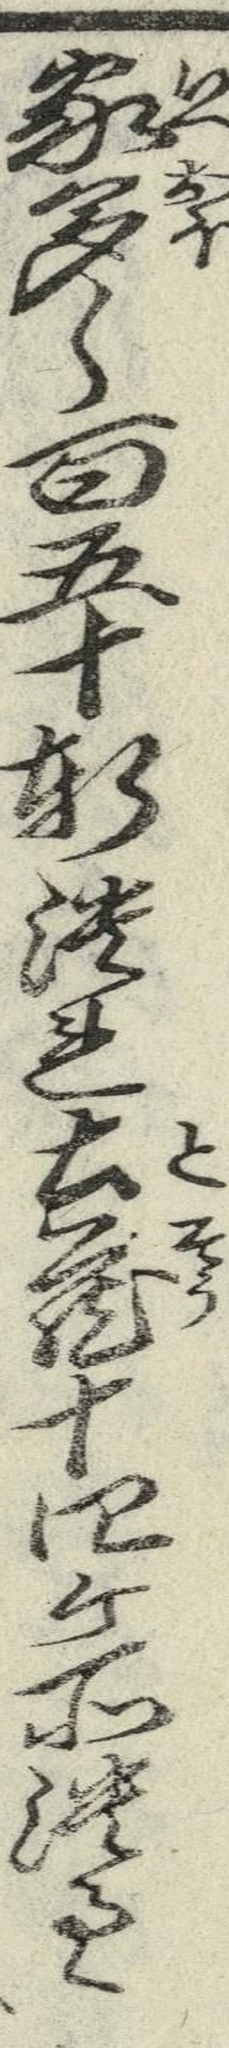家多し百五十軒潰れ土蔵十四ヶ所潰るゝ
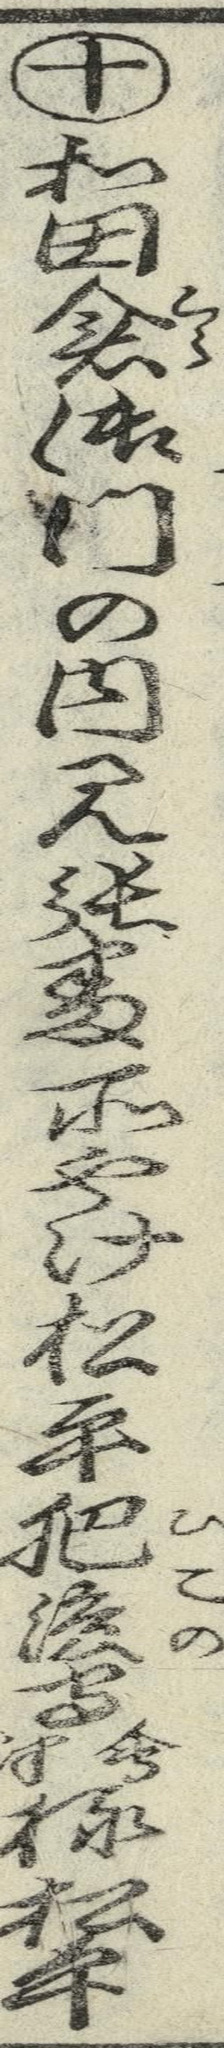㊉和田倉御門の内見張番所やけ松平肥後守会津様松平
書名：地震年代記
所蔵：東京大学地震研究所図書室 Earthquake Research Institute Library, The University of Tokyo, JAPAN
